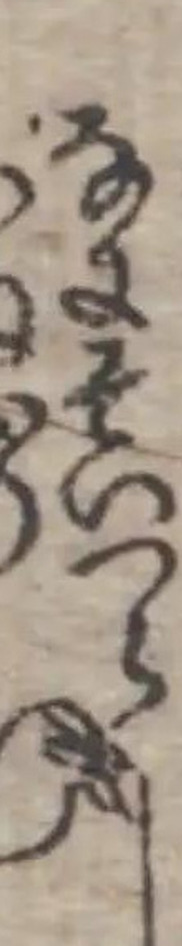なに？そいつら
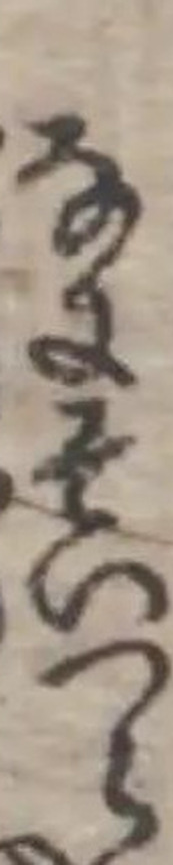なに？そいつら
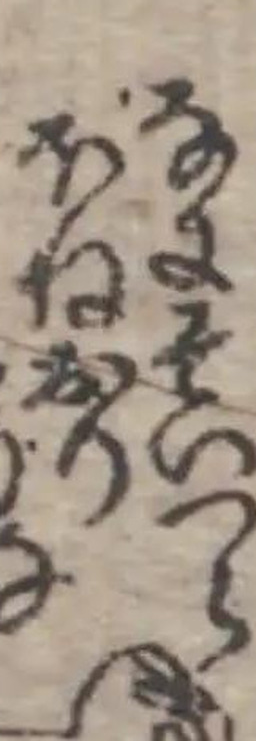ほねおり
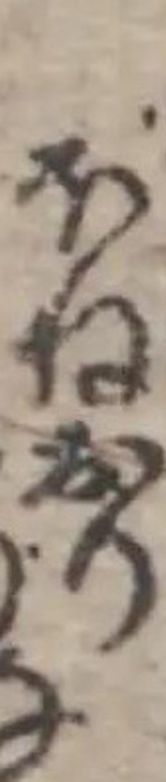ほねおり
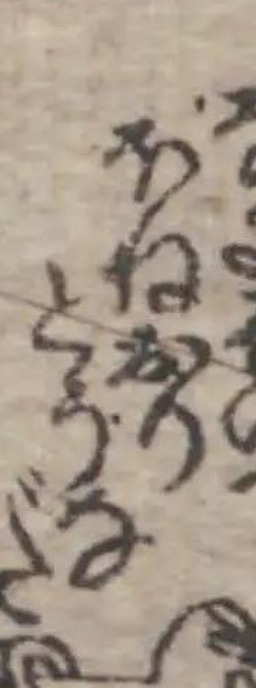ほねおり
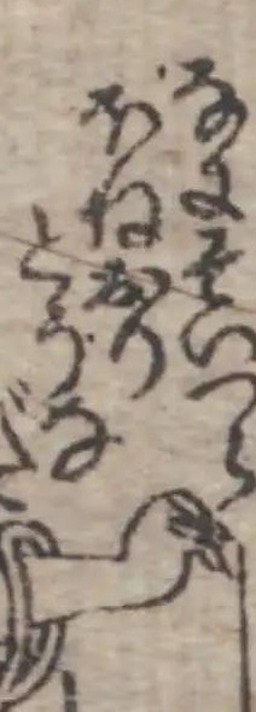ほねおり
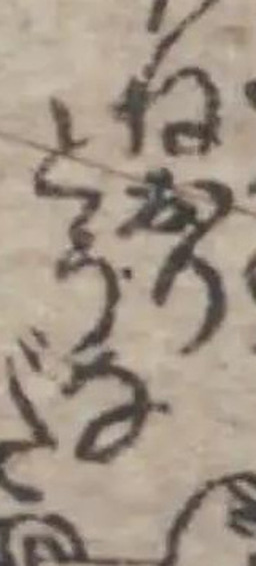とうな
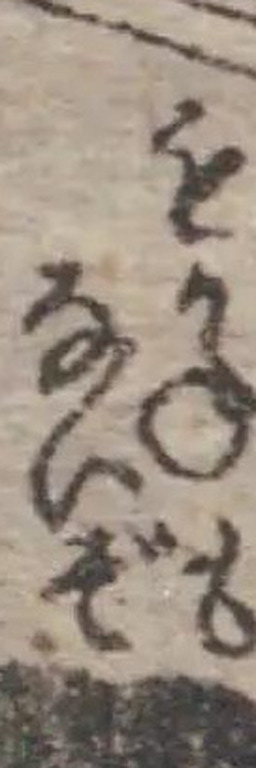ないぞ
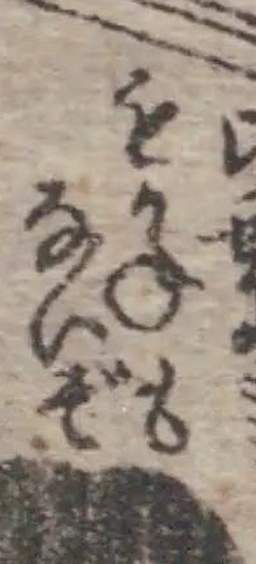もかねも
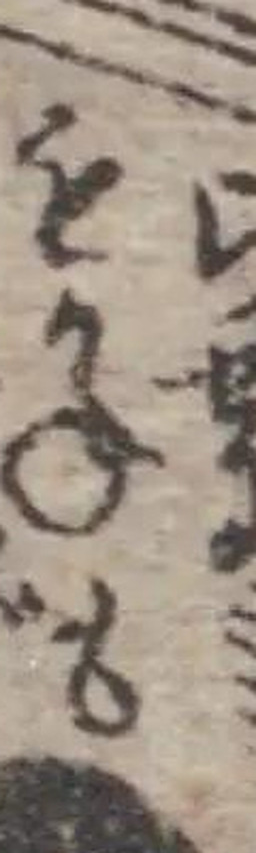もかねも
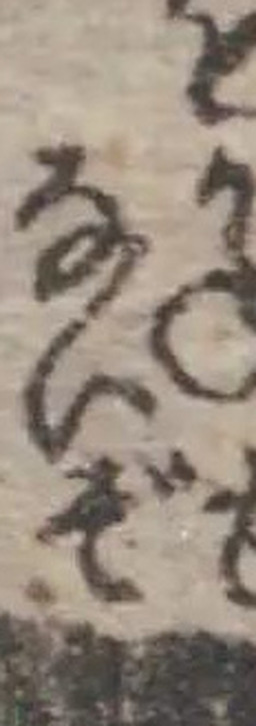ないぞ
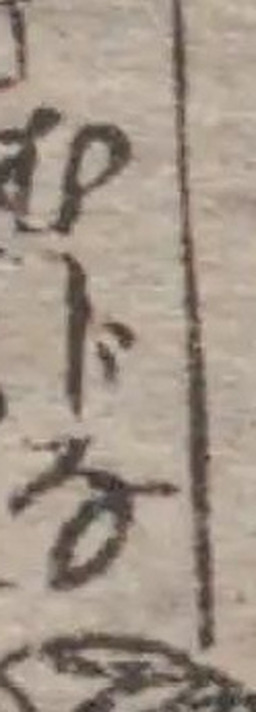むじな
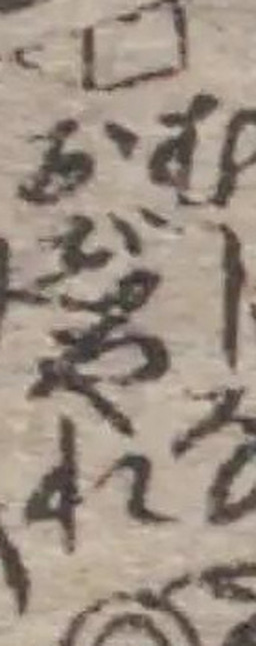おじやれ
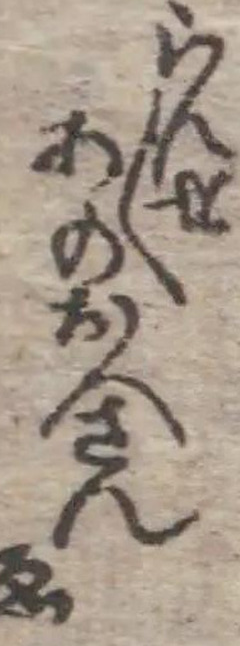あのお人？さん
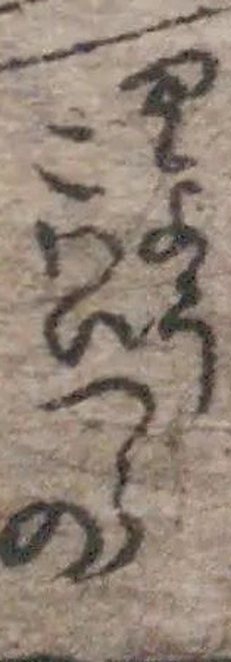こわいつらの

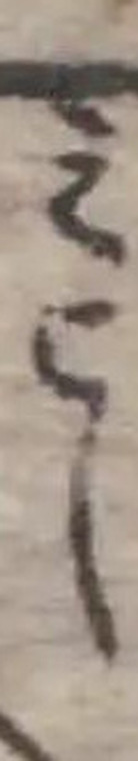みこし
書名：大磯地蔵咄 2巻
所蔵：国立国会図書館 National Diet Library, JAPAN
